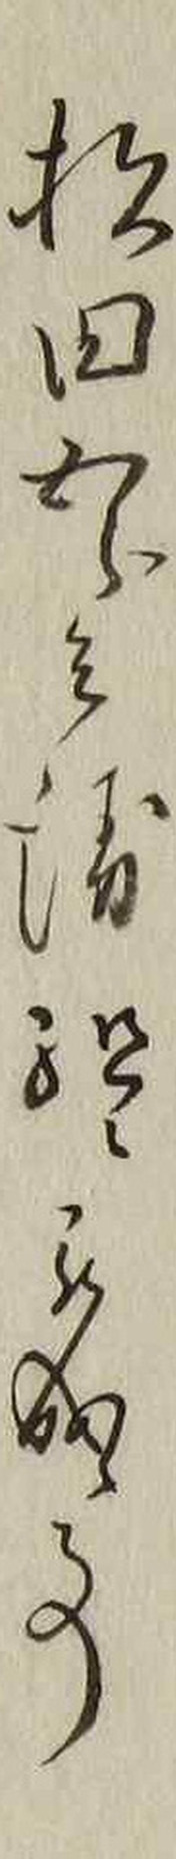杉田五郎兵衛組に罷成候事
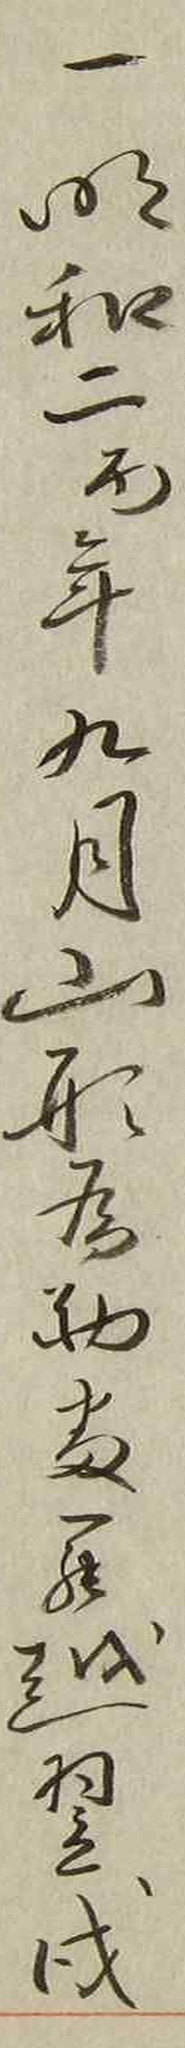一明和二酉年九月山形為勤番罷越翌戌
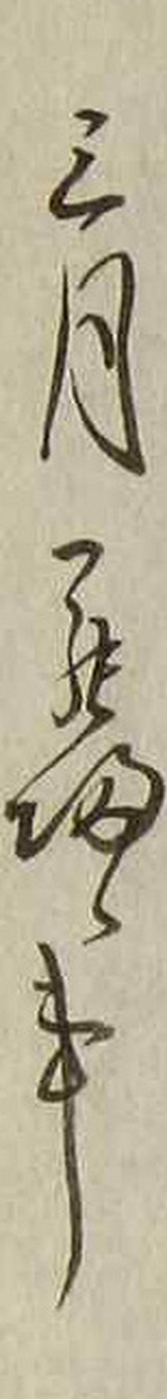三月罷帰候事

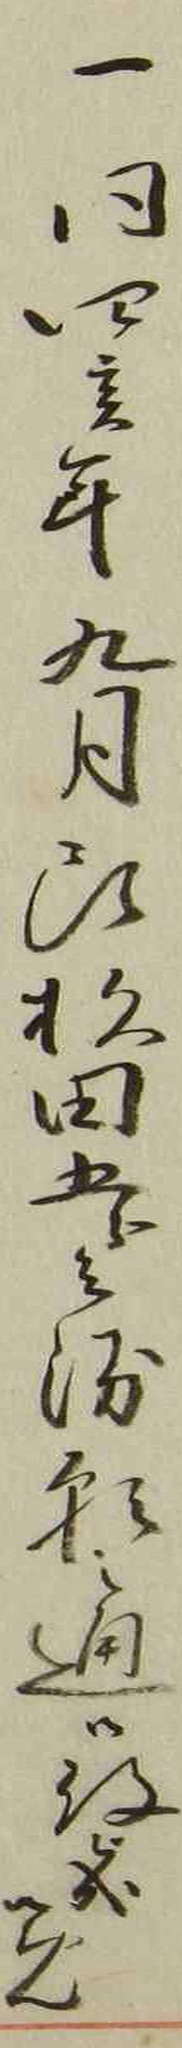一同四亥年九月頭杉田五郎兵衛願之通御役被成御免
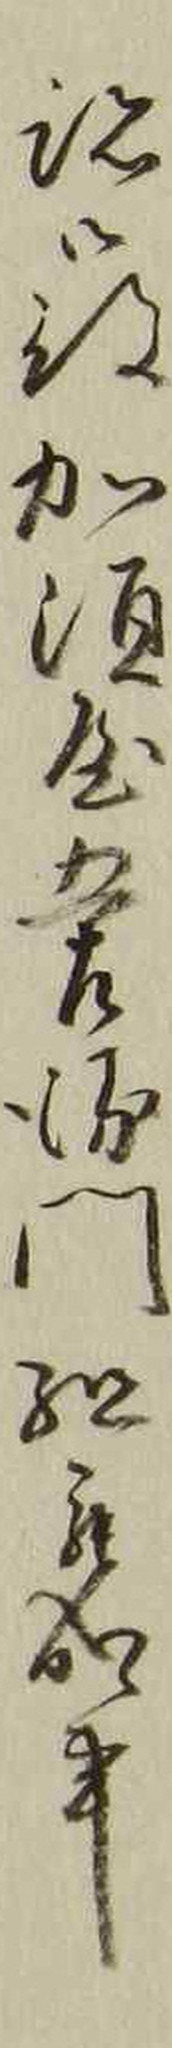跡御役加須屋五左衛門組罷成候事
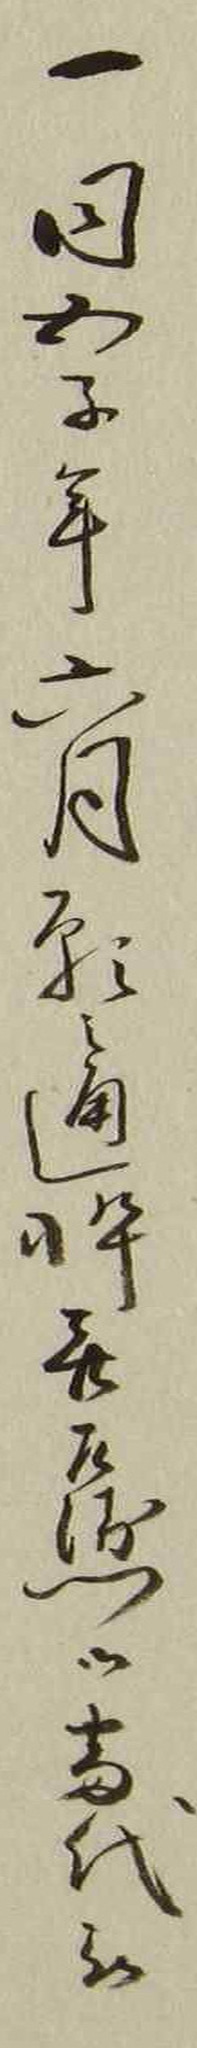一同五子年六月願之通忰喜左衛門御番代被
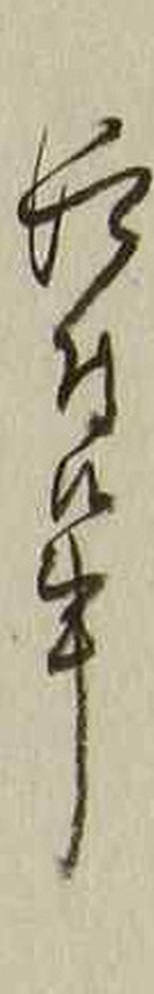仰付候事
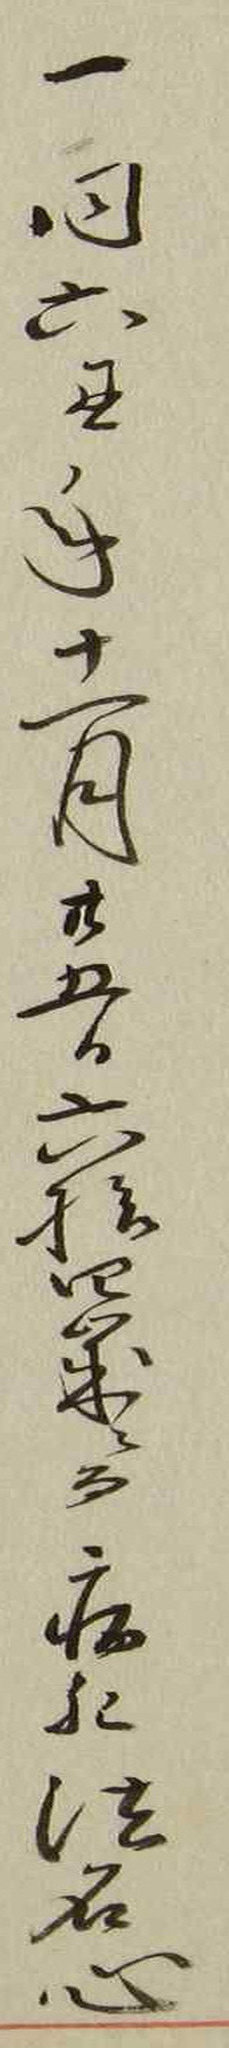一同六丑年十一月廿五日六拾四歳に而病死法名心
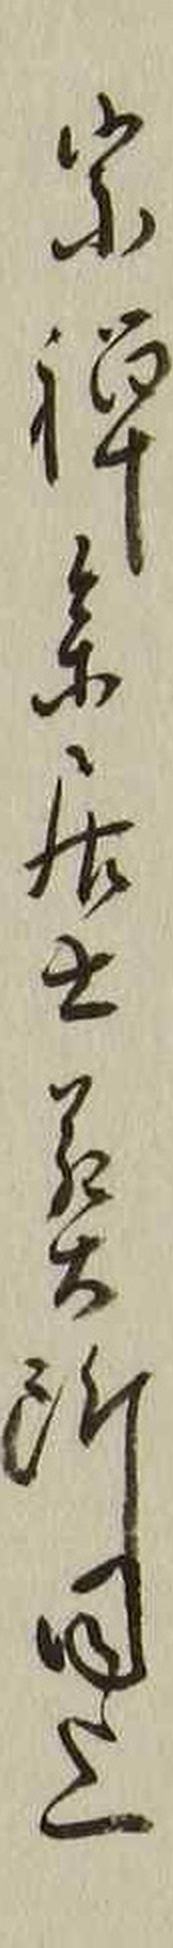宗禅参居士葬所同上
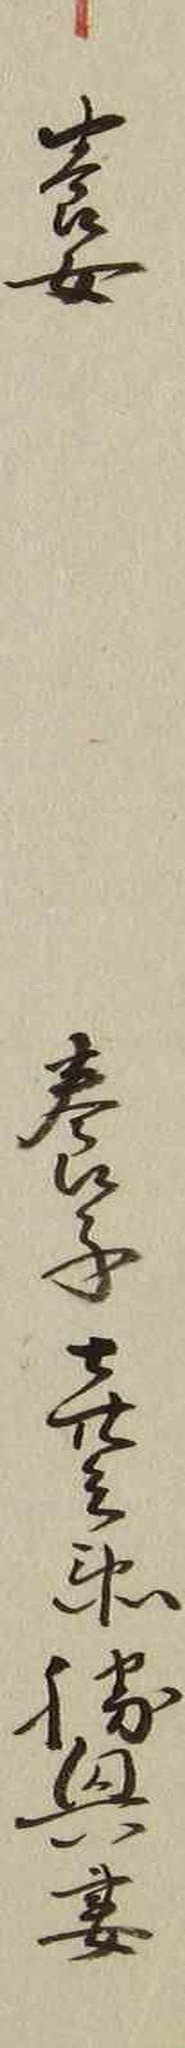養女養子喜兵衛勝興妻
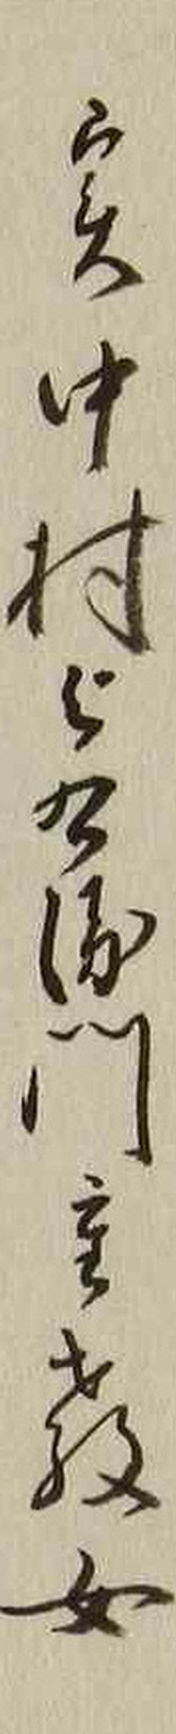実中村与右衛門重教女
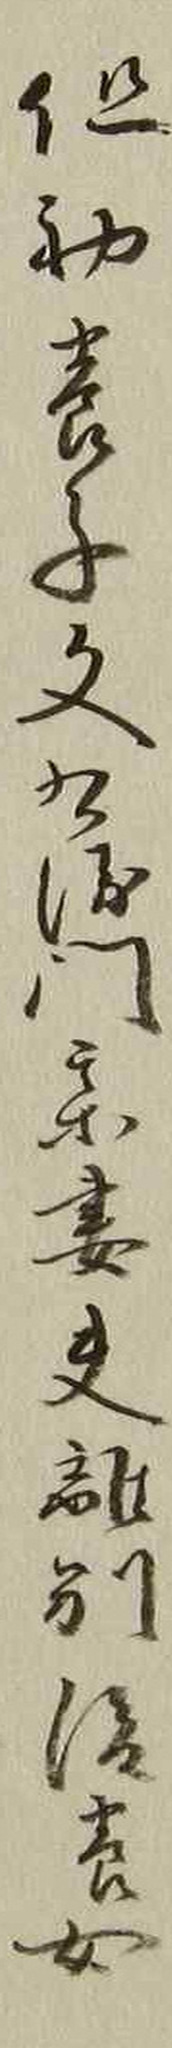但初養子文右衛門某妻夫離別後養女
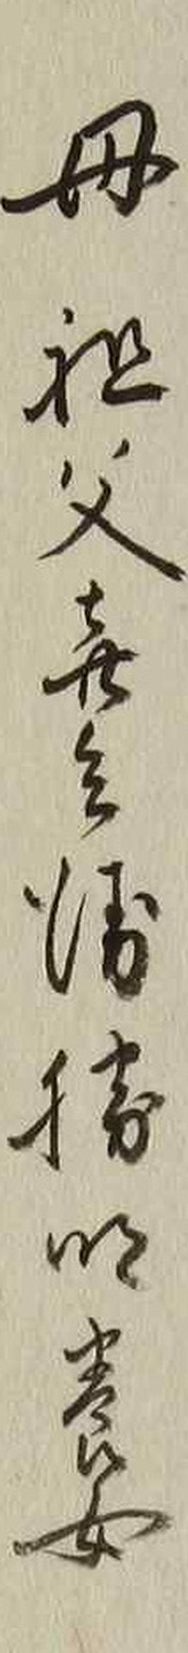母祖父喜兵衛勝明養女
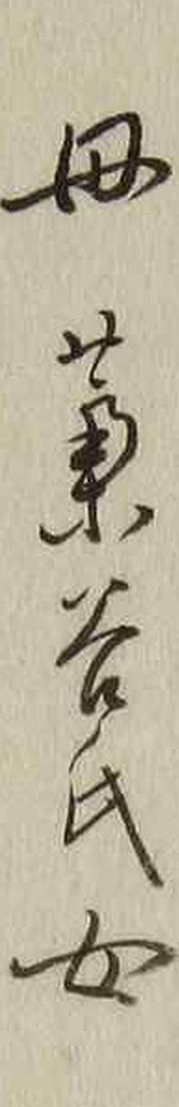母藁谷氏女
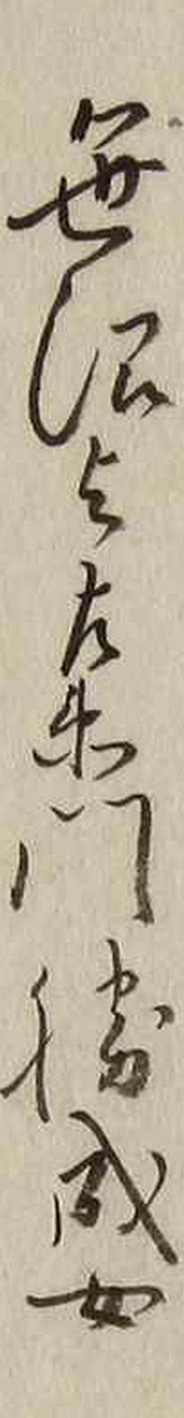笹沼与左衛門勝成女
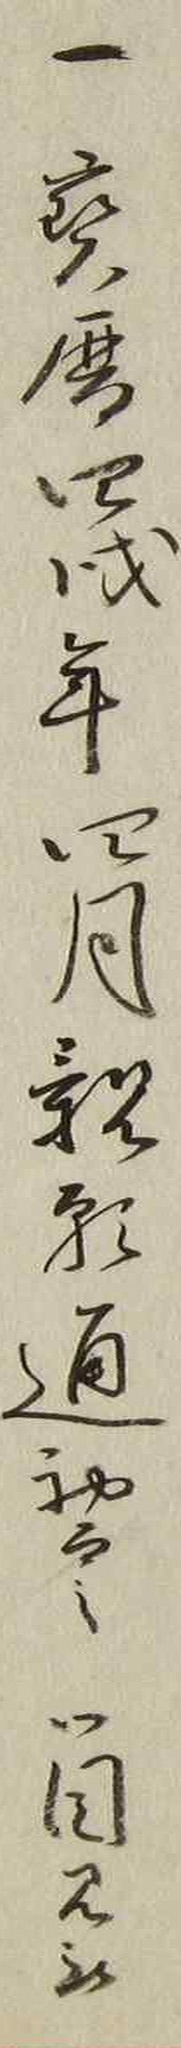一宝暦四戌年四月親願通初而之御目見被
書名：諸士系譜　巻之6　い之部6
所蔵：会津若松市立会津図書館
